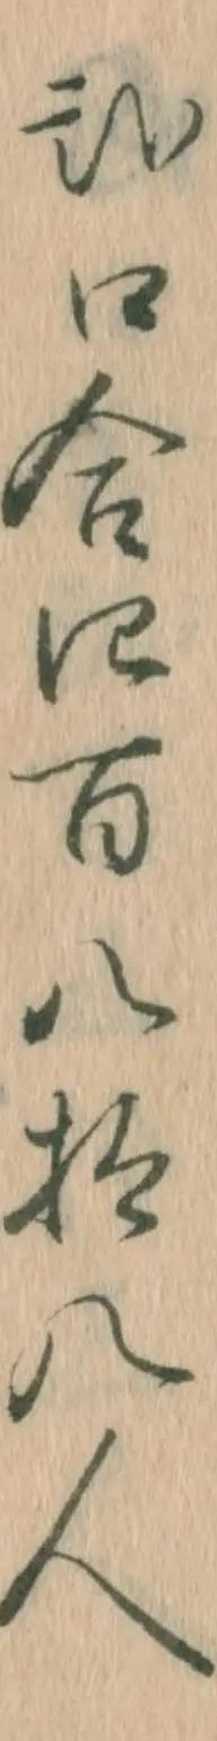弐口合四百八拾八人
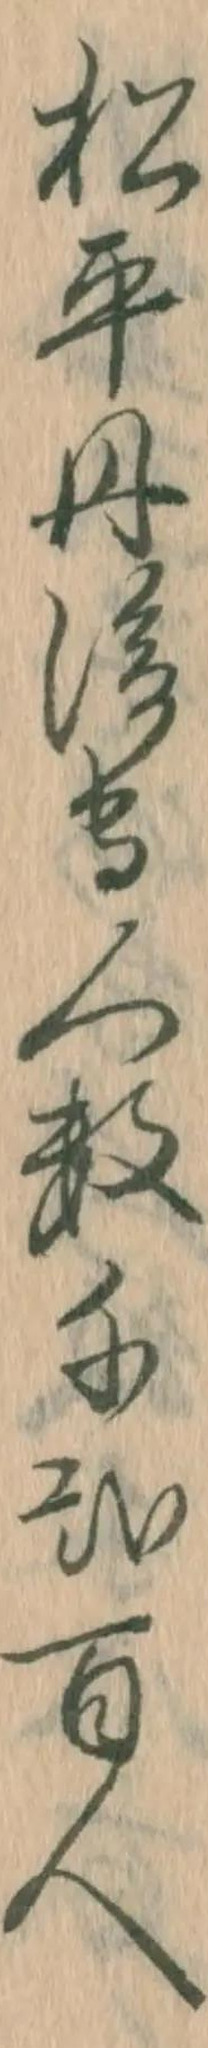松平丹後守人数千弐百人
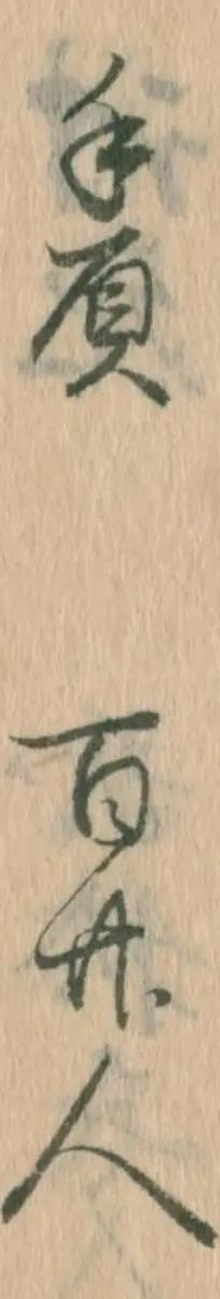手負百廿人
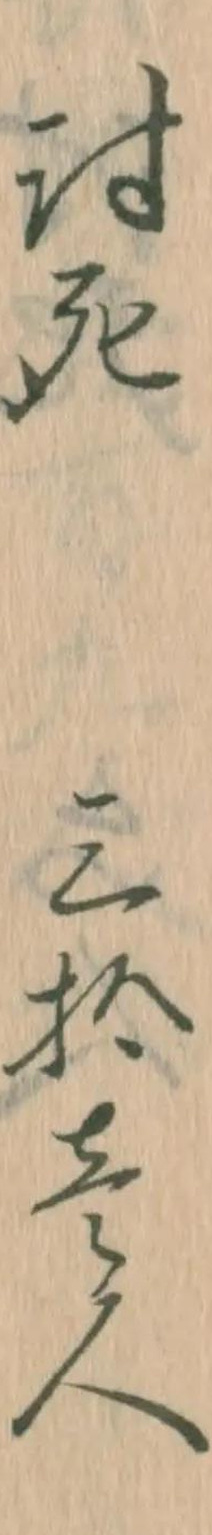討死三拾壱人
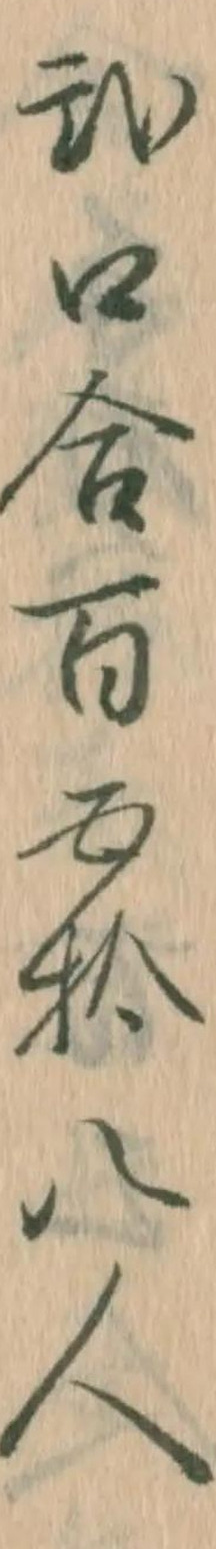弐口合百五拾八人
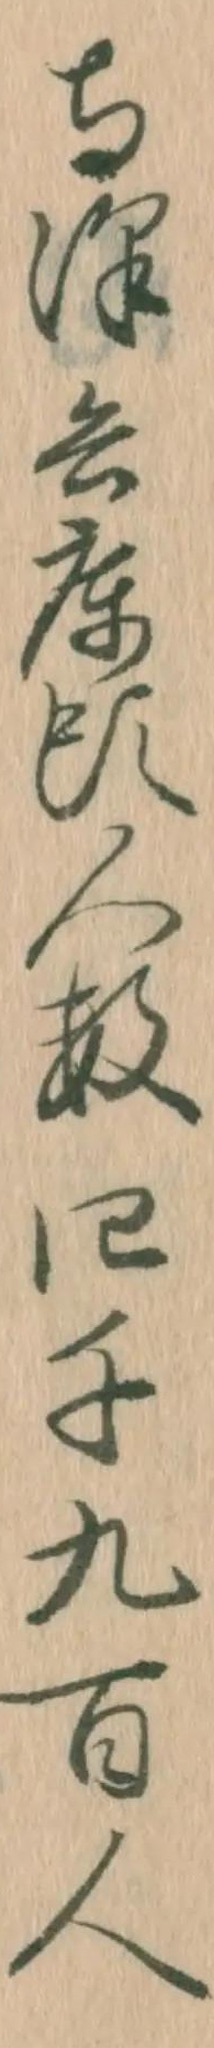寺沢兵庫頭人数四千九百人
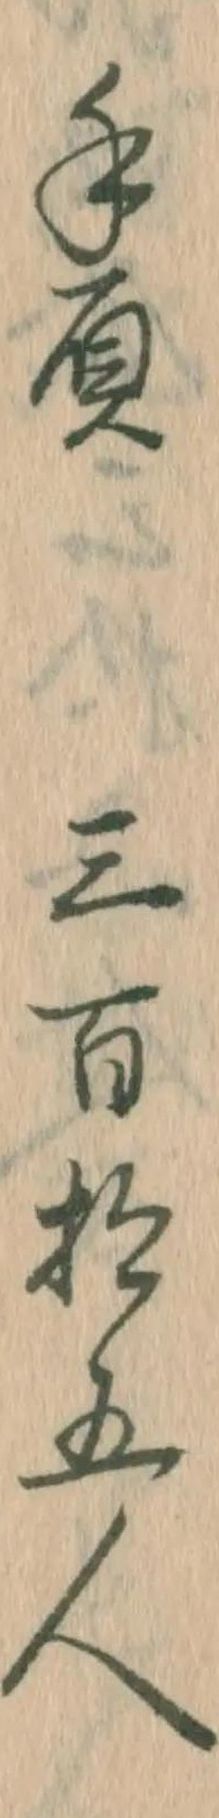手負三百拾五人
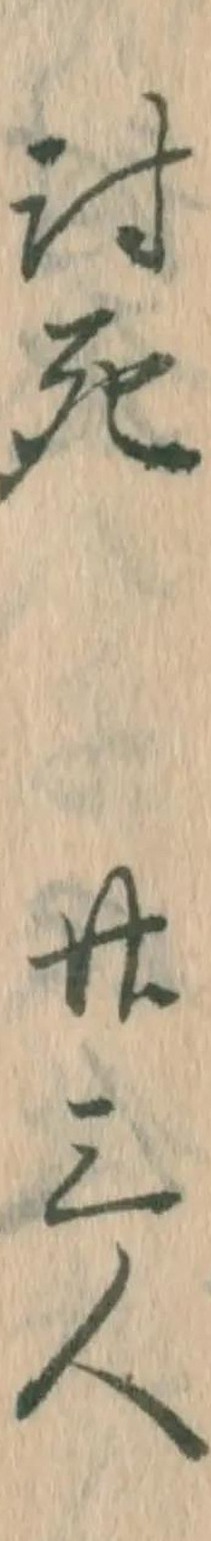討死廿三人
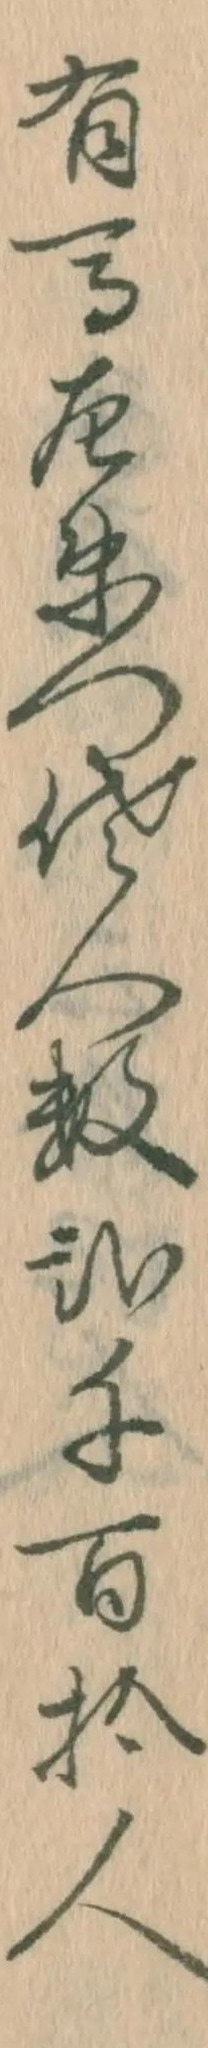有馬左衛門佐人数弐千百拾人
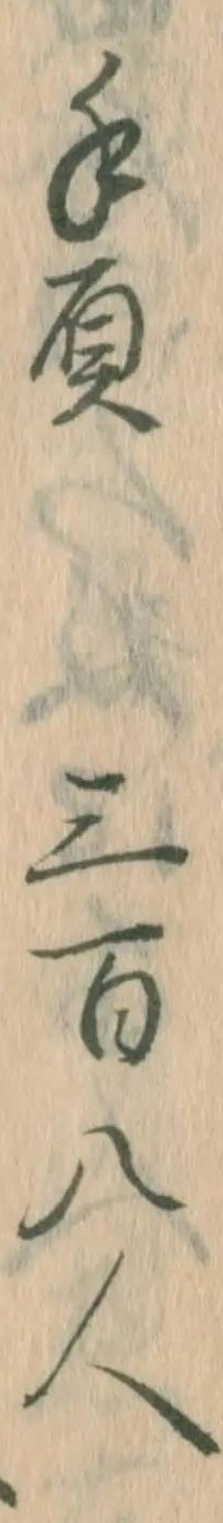手負三百八人
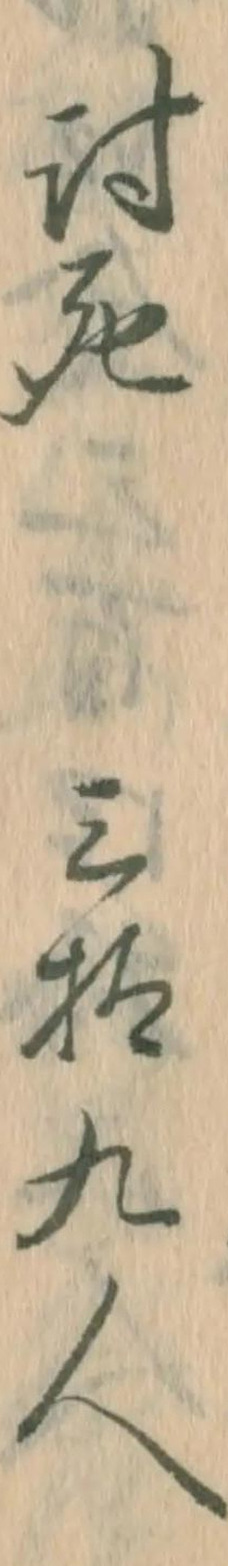討死三拾九人

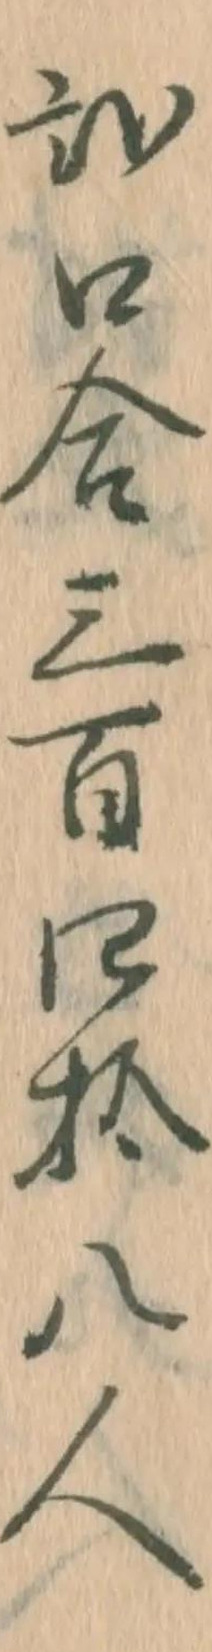弐口合三百四拾八人
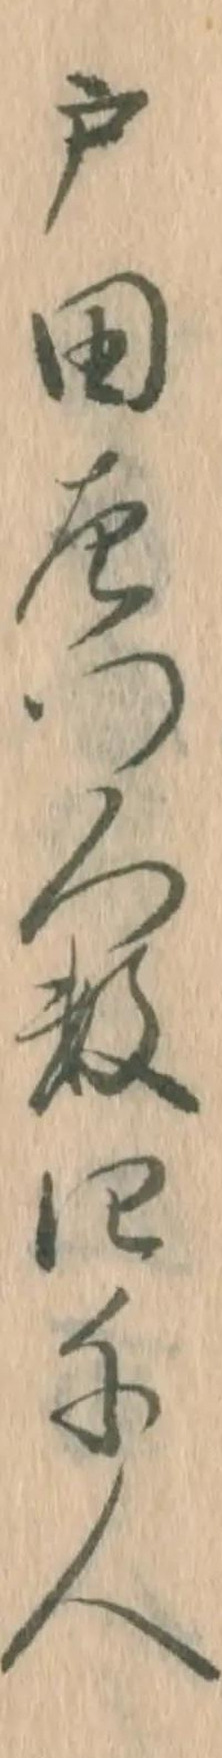戸田左門人数四千人
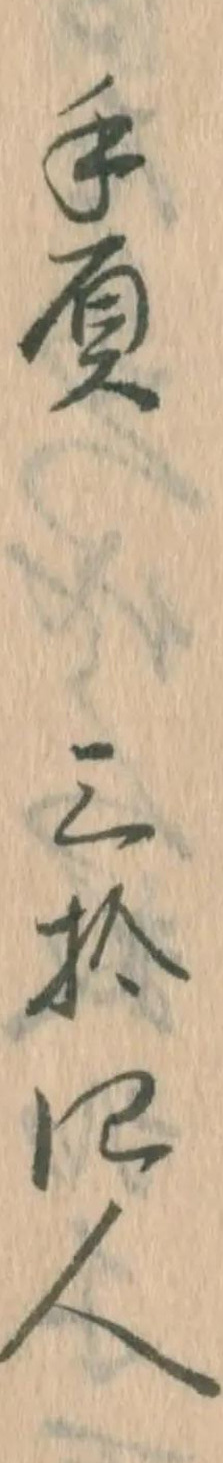手負三拾四人
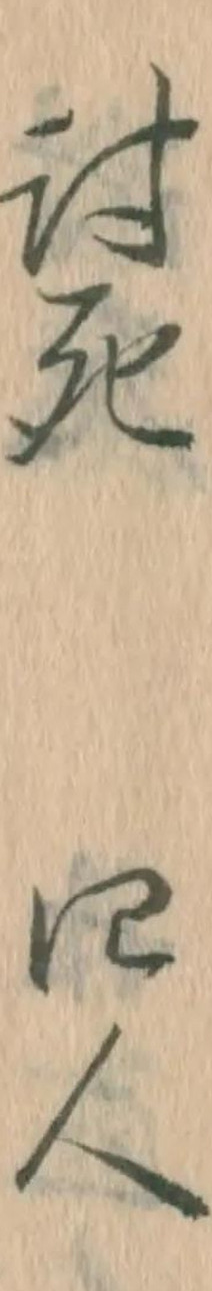討死四人
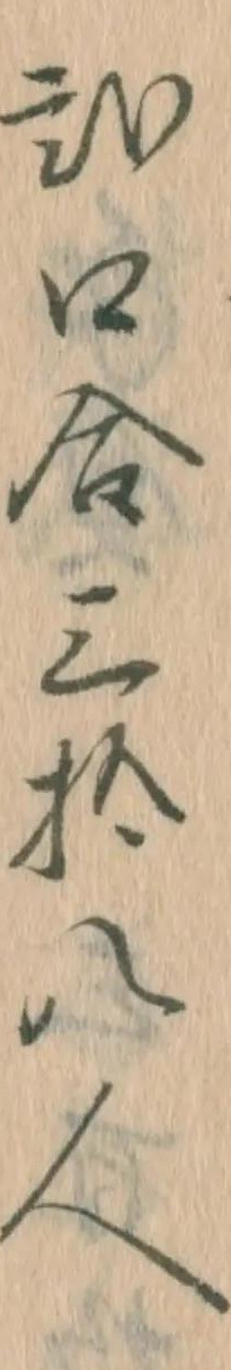弐口合三拾八人
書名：切支丹御退治記 49巻. [9]
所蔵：国立国会図書館 National Diet Library, JAPAN
